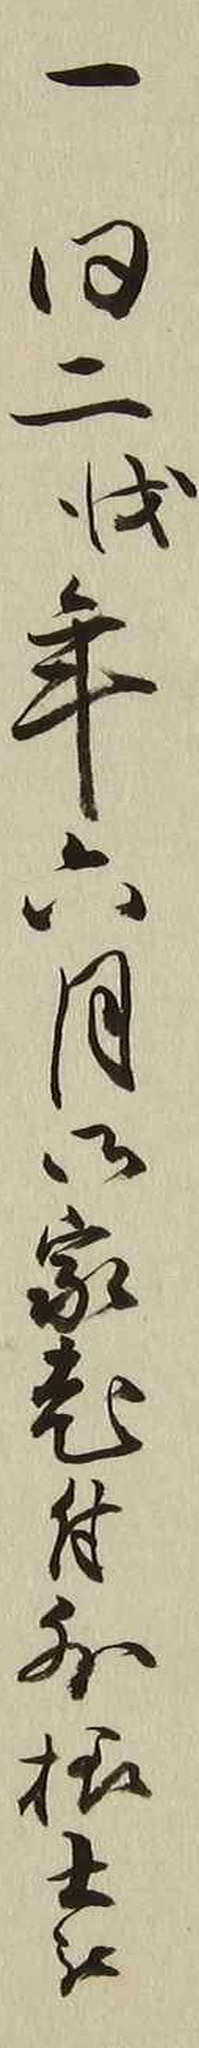一同二戌年六月御家老付外様士被
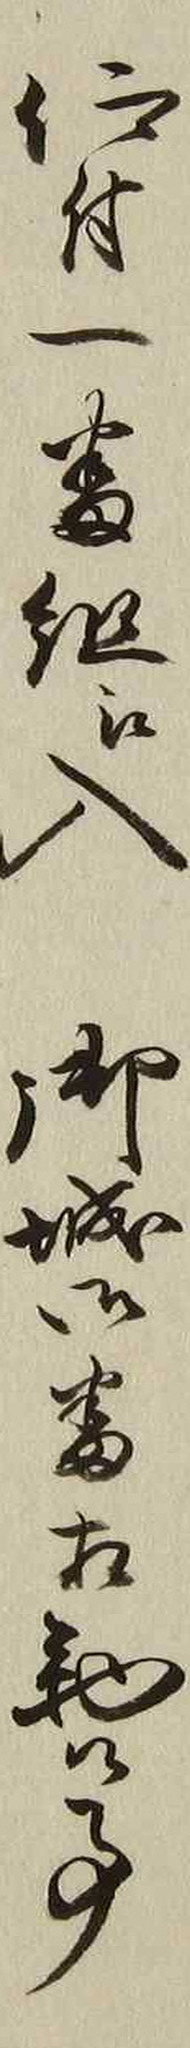仰付一番組江入御城御番相勤候事
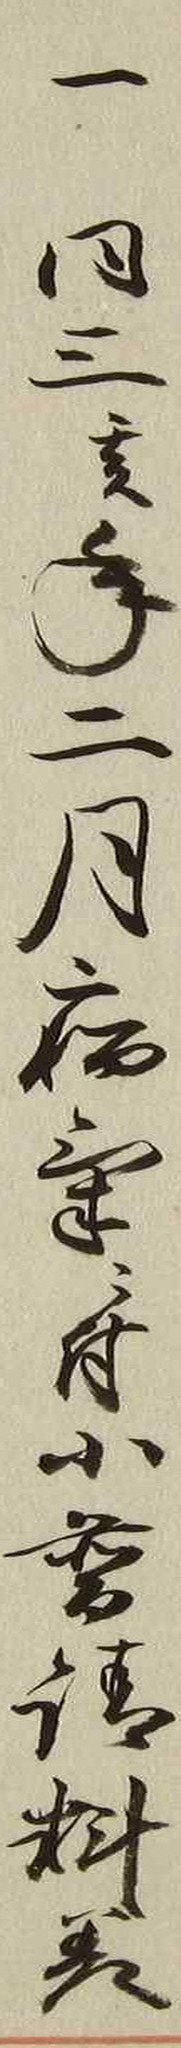一同三亥年二月病気ニ付小普請料差
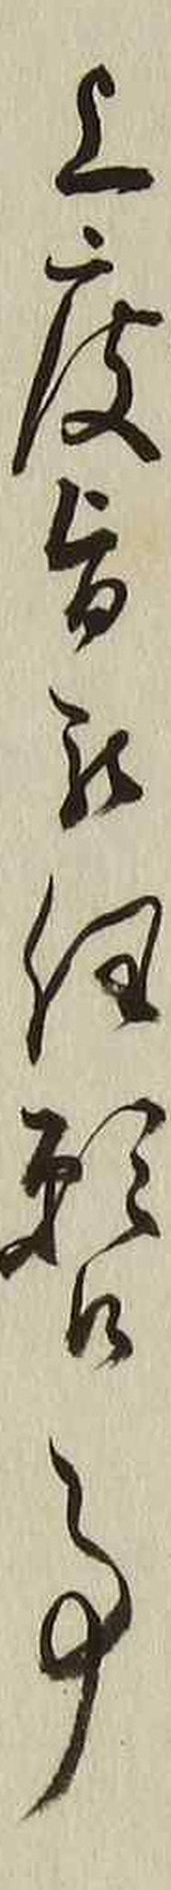上度旨被任願候事
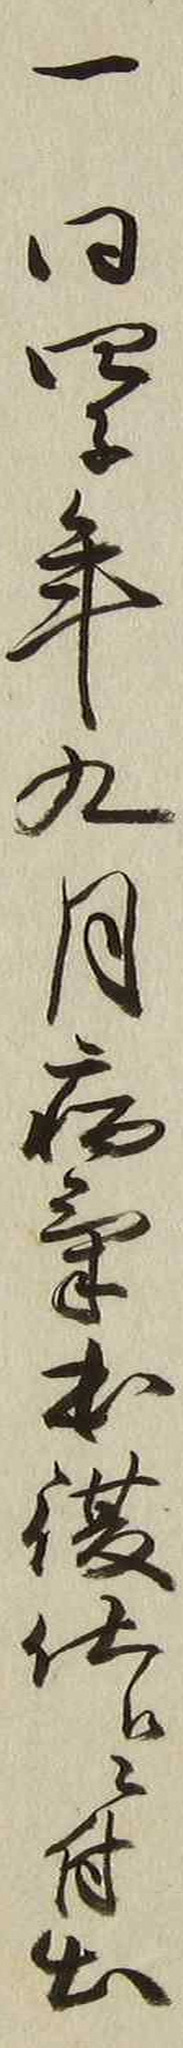一同四子年九月病気本復仕候ニ付出
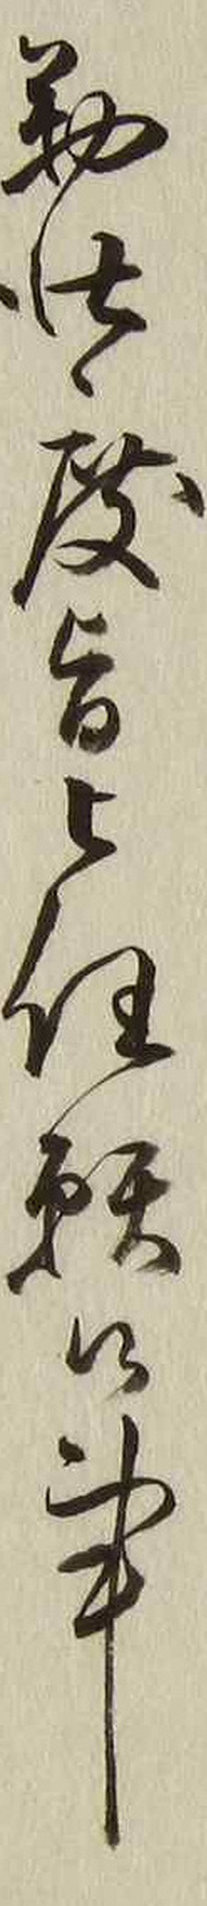勤仕度旨被任願候事
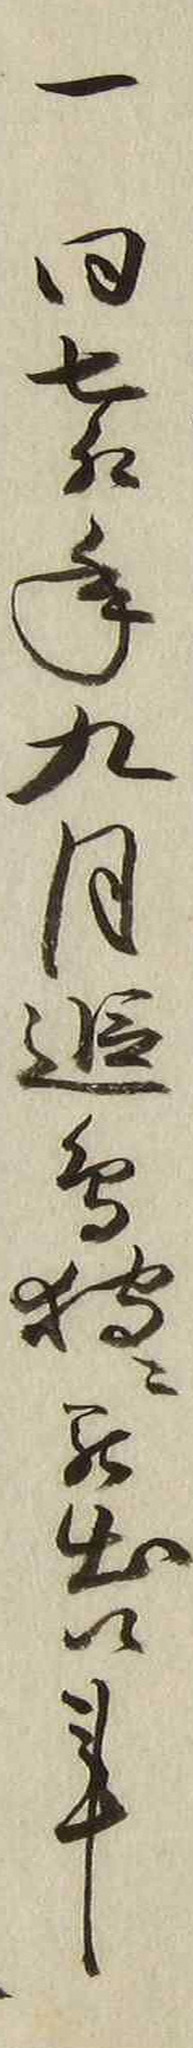一同七卯年九月追鳥狩ニ罷出候事
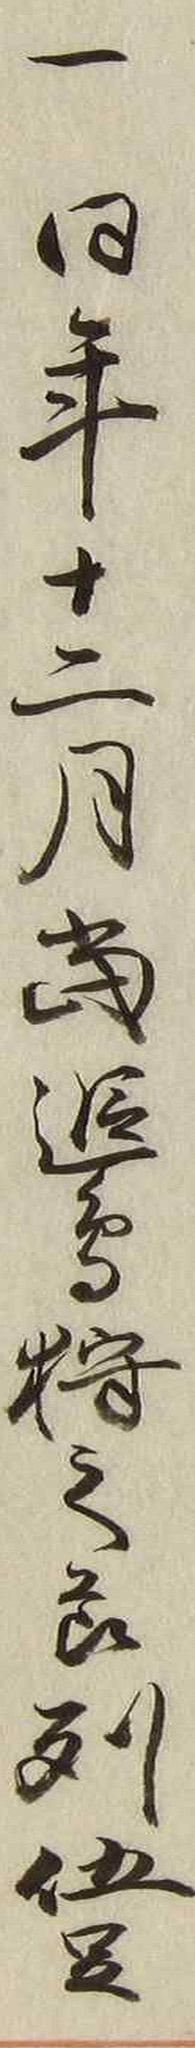一同年十二月当追鳥狩之節列伍足
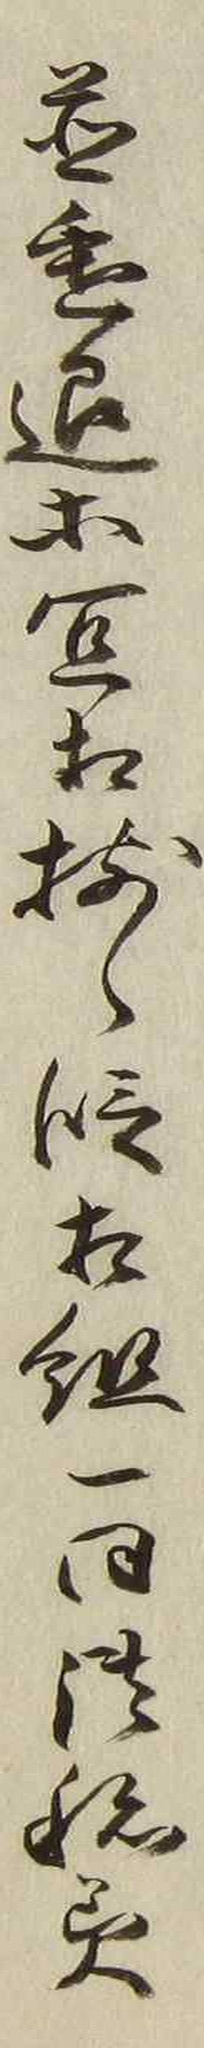並進退等宜相揃候段相組一同御称美
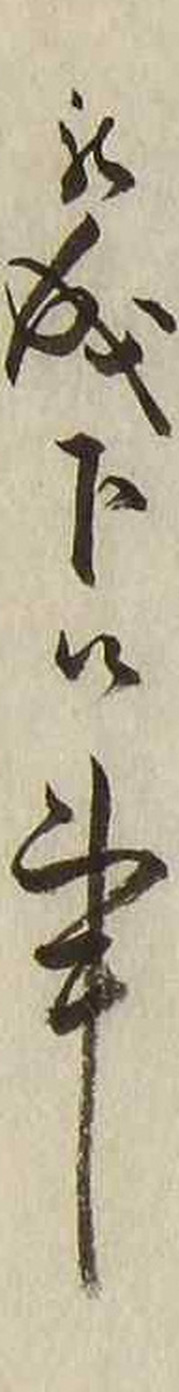被成下候事

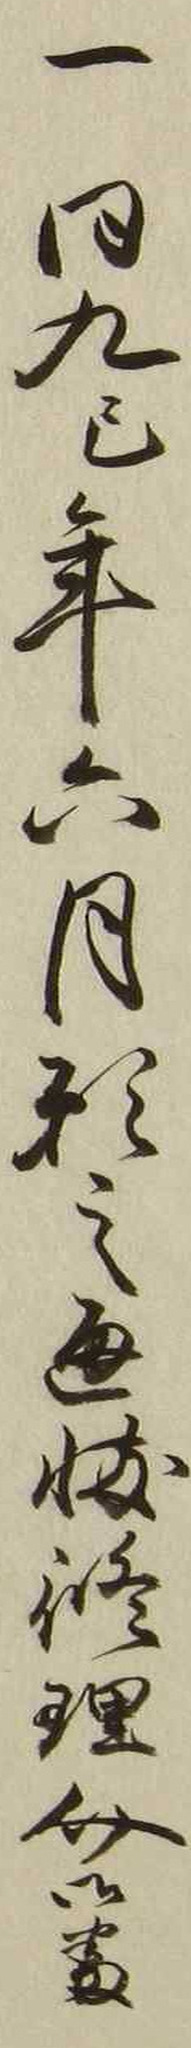一同九巳年六月願之通悴修理介御番
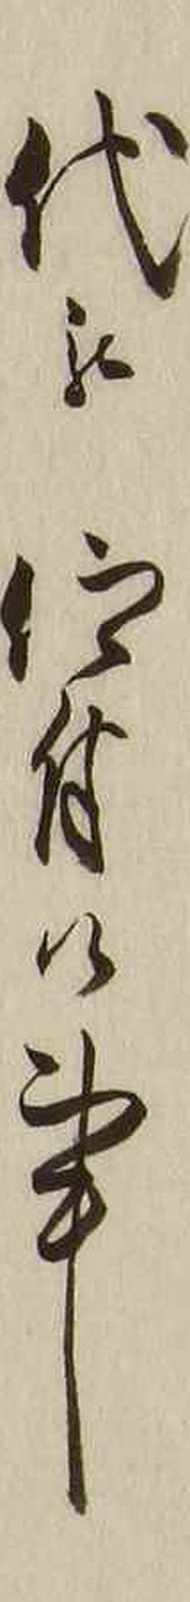代被仰付候事
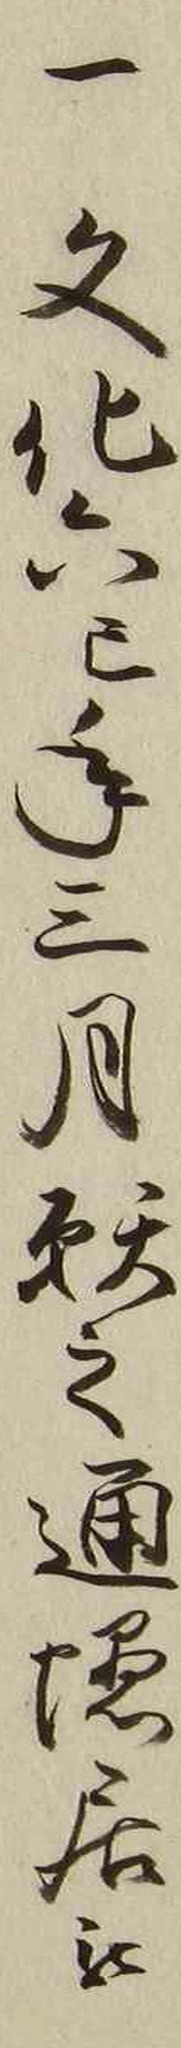一文化六巳年三月願之通隠居被
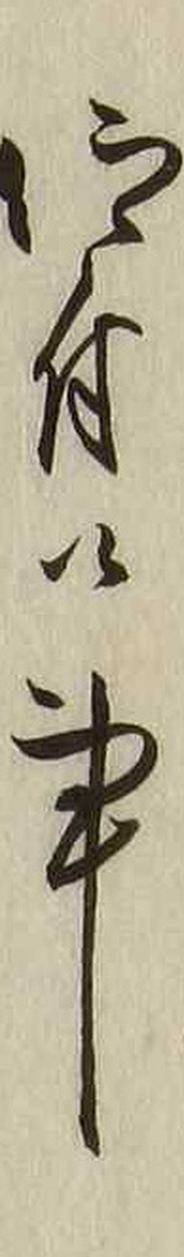仰付候事
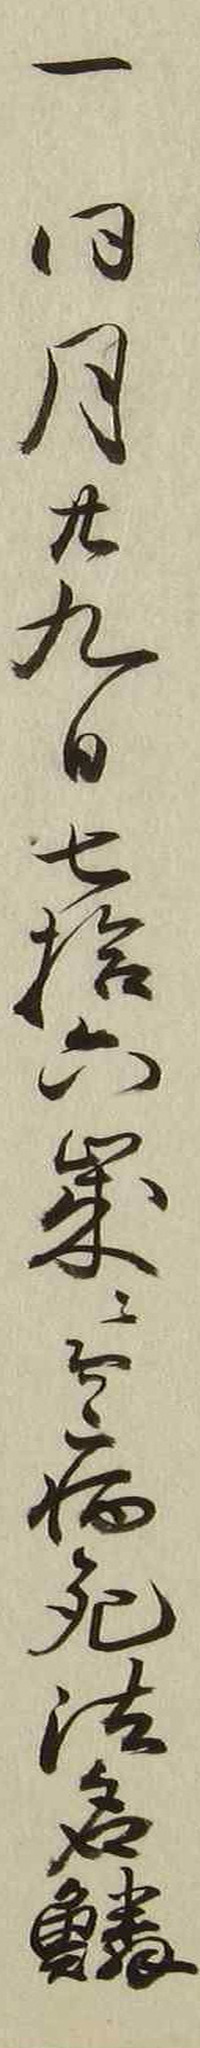一同月廿九日七拾六歳ニ而病死法名鱗
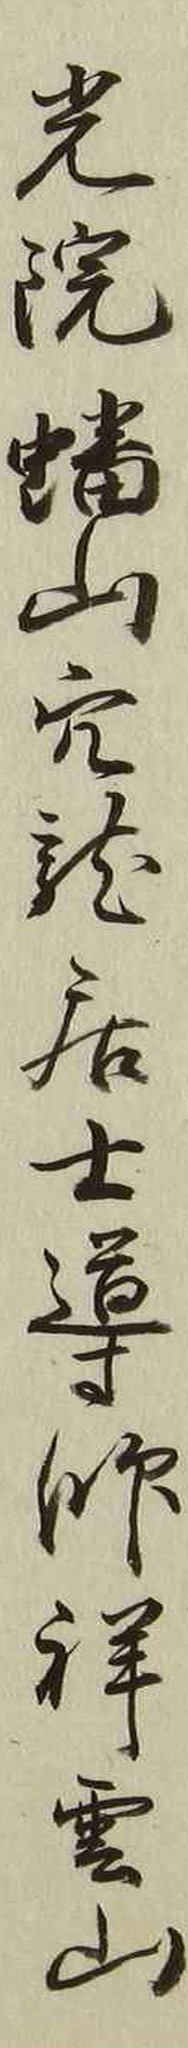光院蟠山穴龍居士導師祥雲山
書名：諸士系譜　巻之21　い之部21
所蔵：会津若松市立会津図書館
